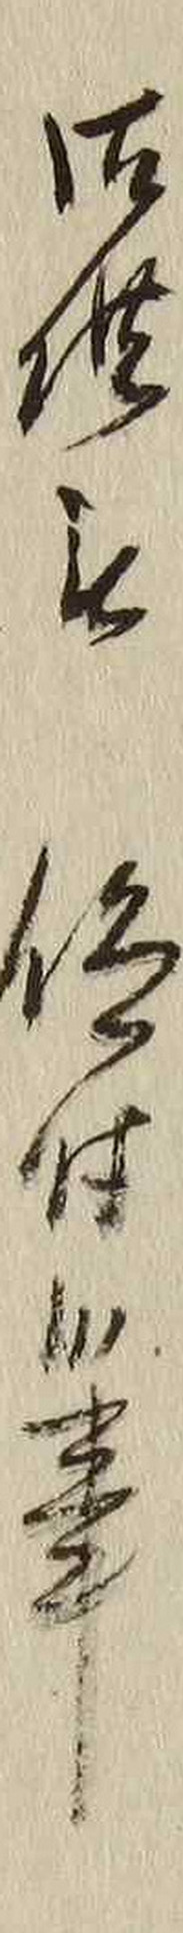御供被仰付候事
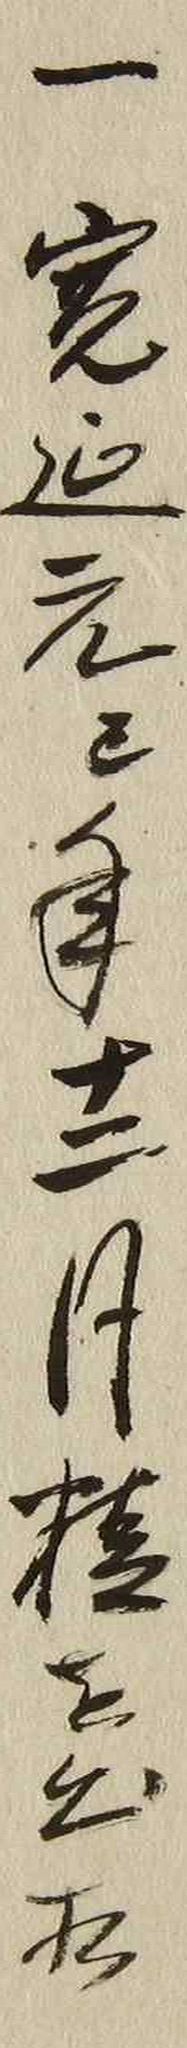一寛延元巳年十二月精を出相
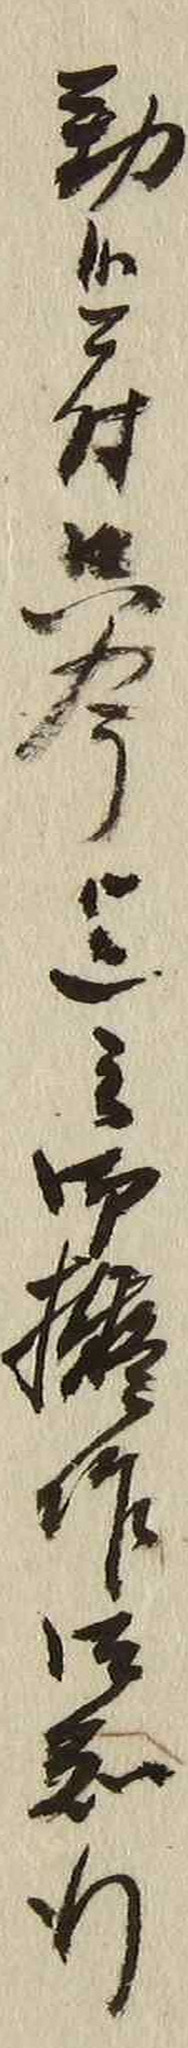勤候ニ付只今迄之御擬作御知行
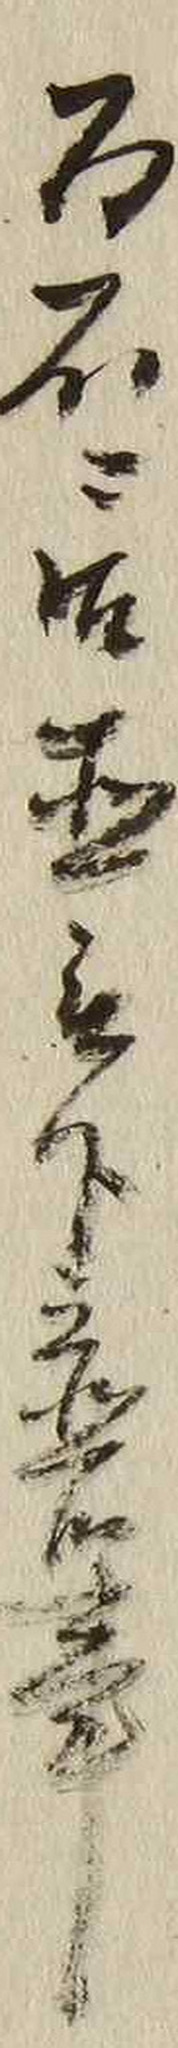百石ニ御直被下置候事
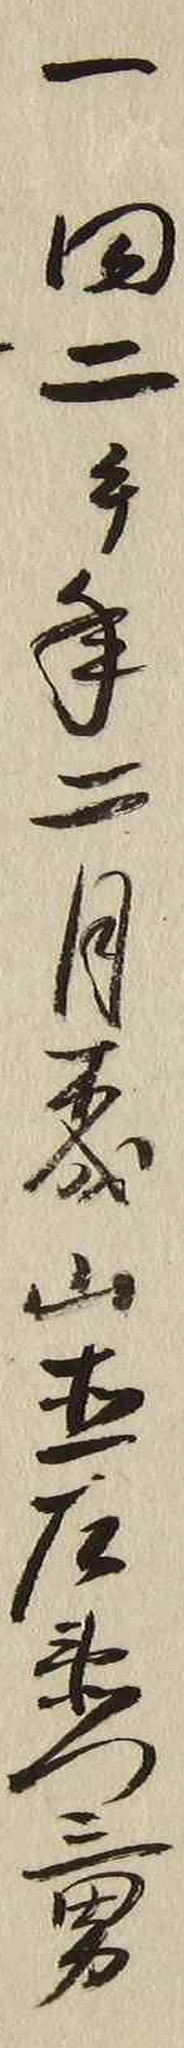一同二午年二月森山直左衛門三男
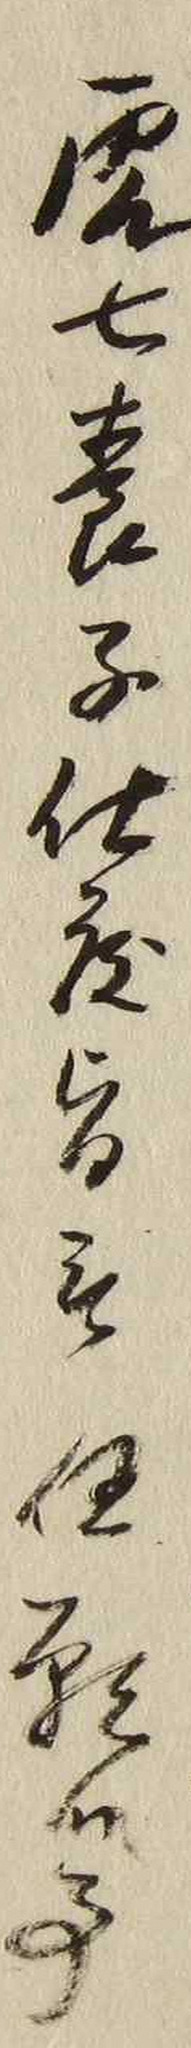虎七養子仕度旨被任願候事
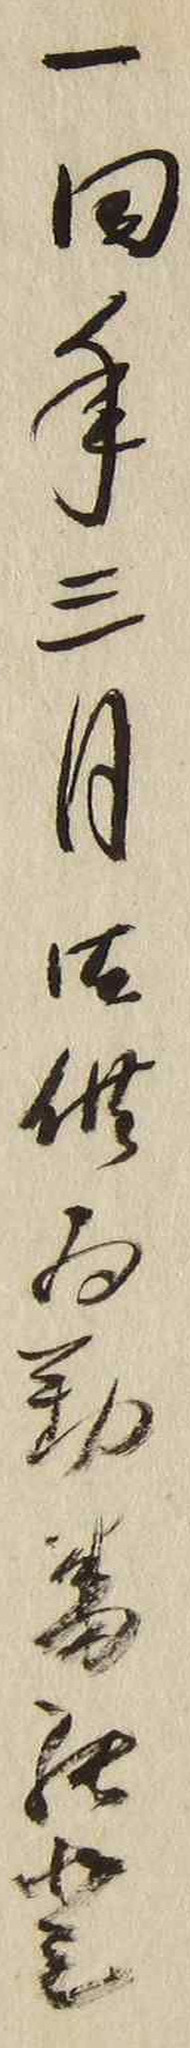一同年三月御供為勤番罷登

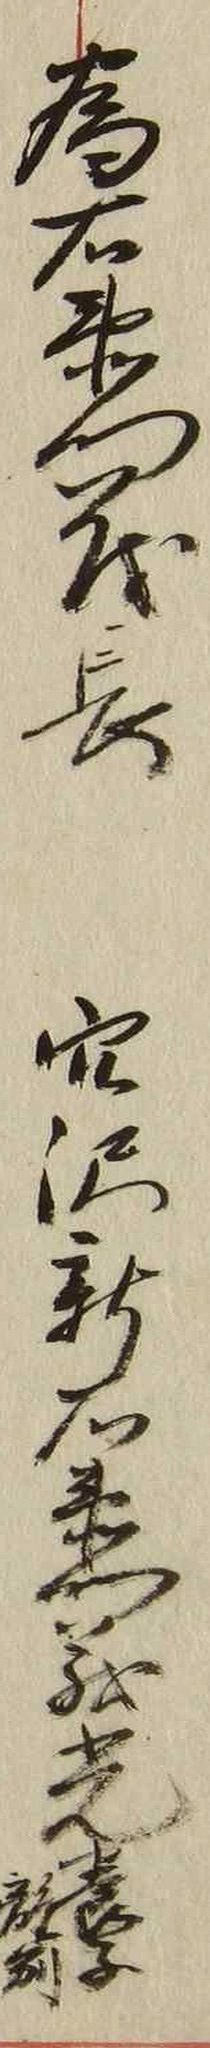為右衛門茂長穴沢新右衛門義光養子離別
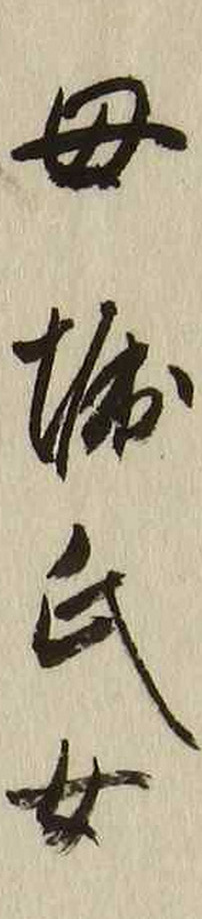母堀氏女
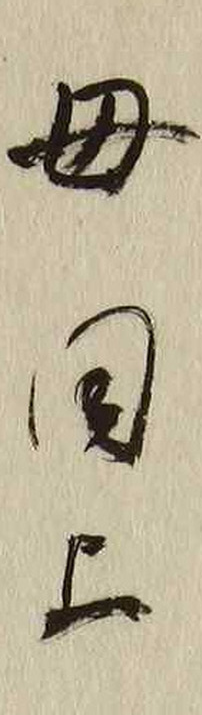母同上
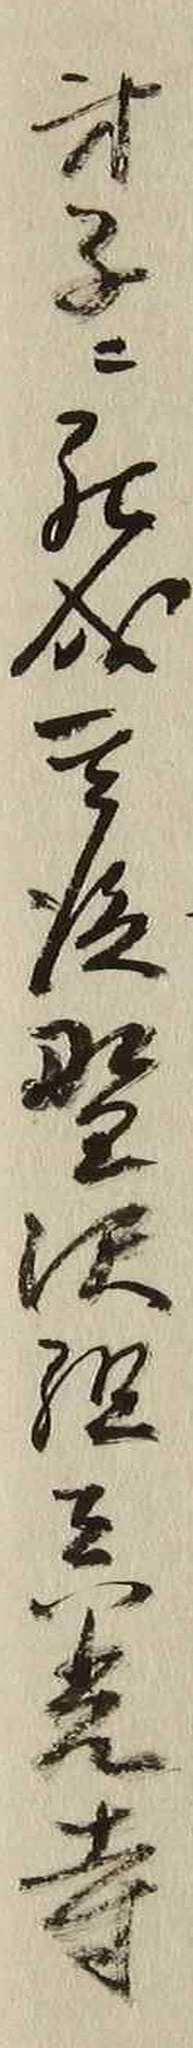弟子ニ罷成其後野沢組真光寺
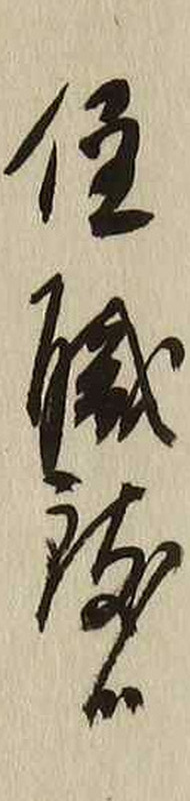住職致候
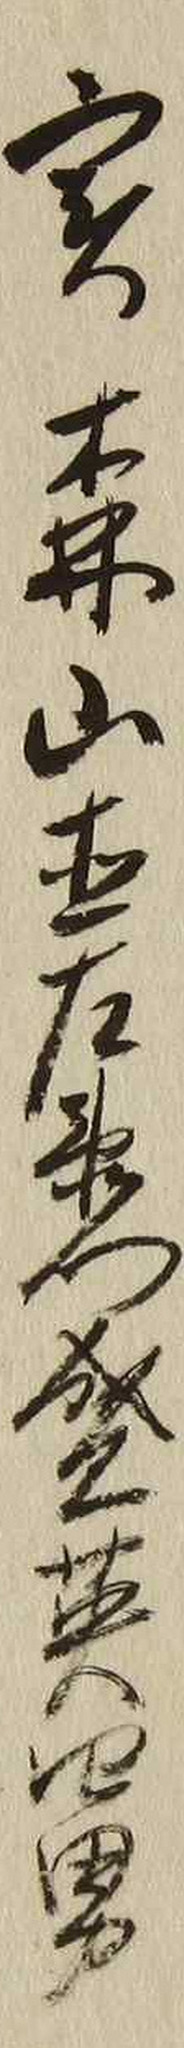実森山直左衛門盛英四男
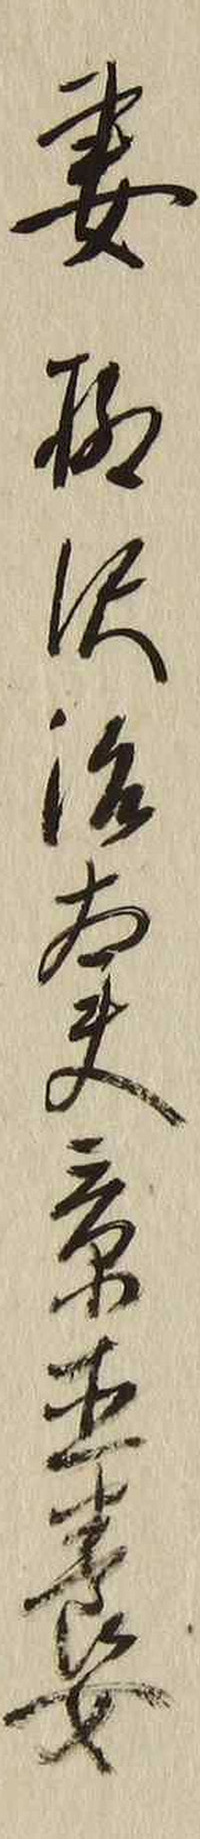妻柳沢治太夫景直養女
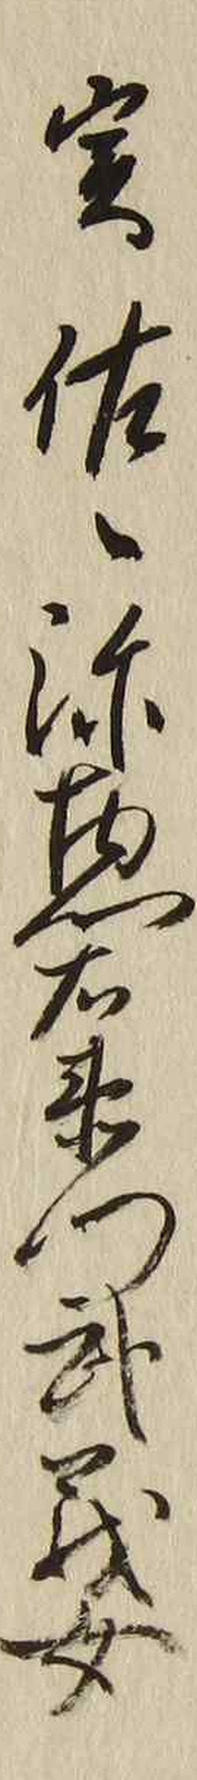実佐々弥惣右衛門武義女

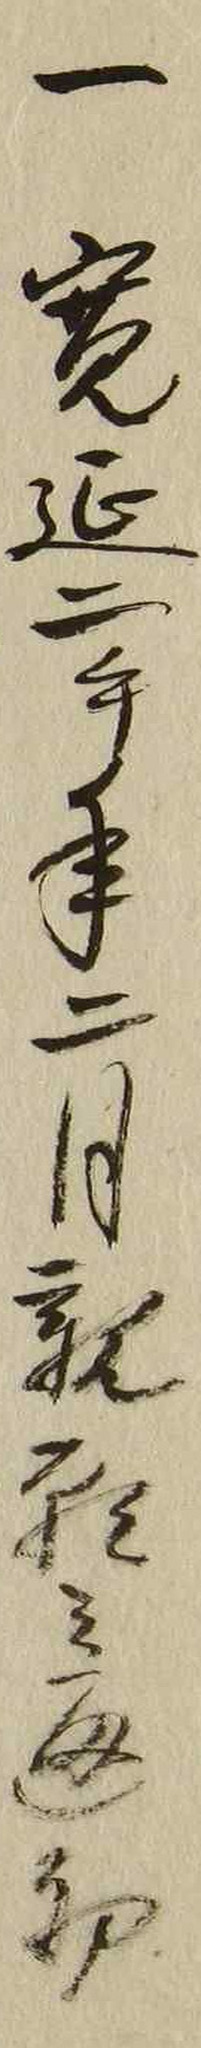一寛延二午年二月親願之通初
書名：諸士系譜　巻之346　も之部2
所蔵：会津若松市立会津図書館
